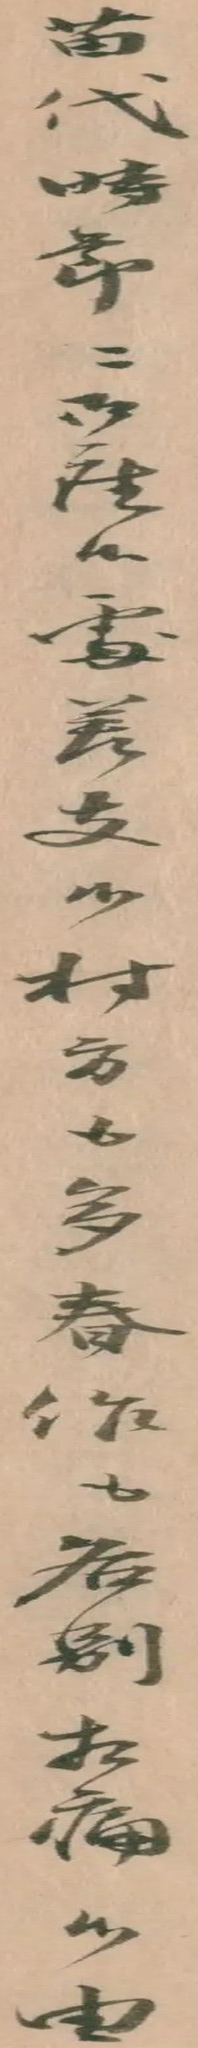苗代時節二御座候処差支候村方も多春作も各別相痛候由
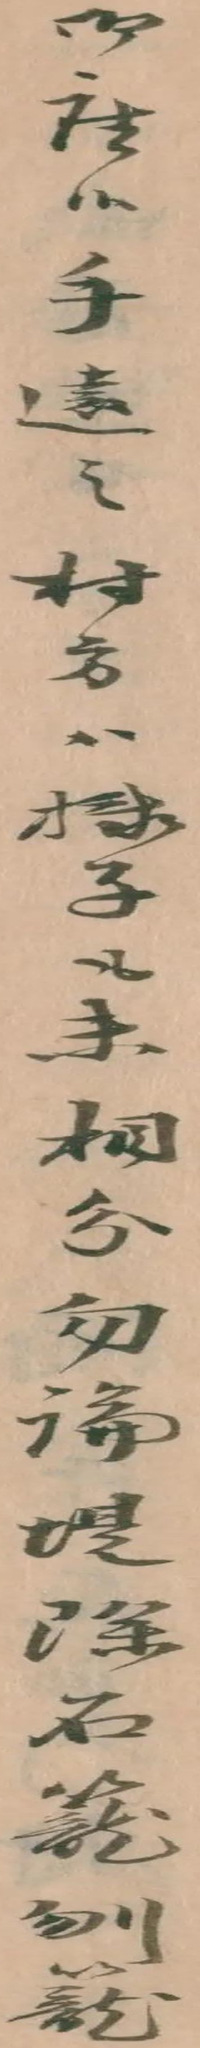御座候手遠之村方ハ様子も未相分勿論堤除石籠刎籠
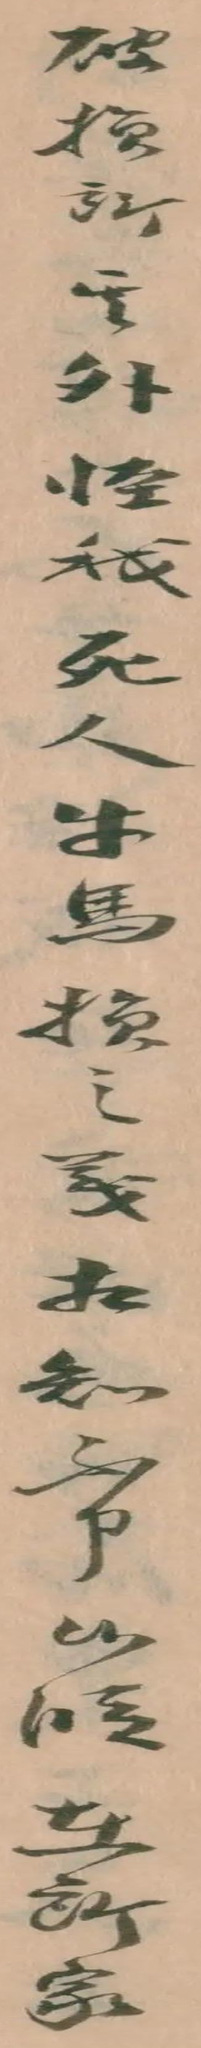破損所其外怪我死人牛馬損之事相知不申候段在所家
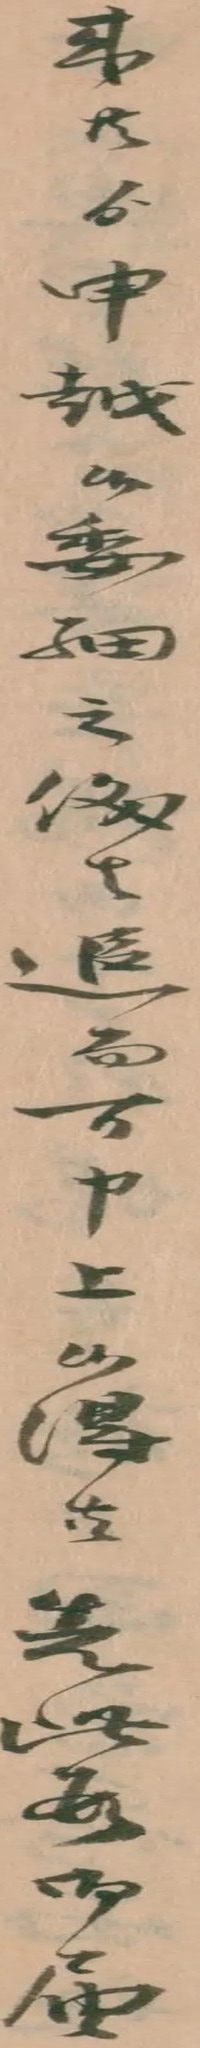来共ゟ申越候委細之義ハ追而可申上候得共先此段御届
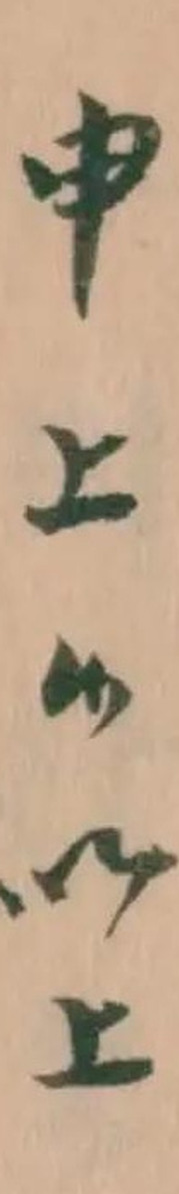申上候以上
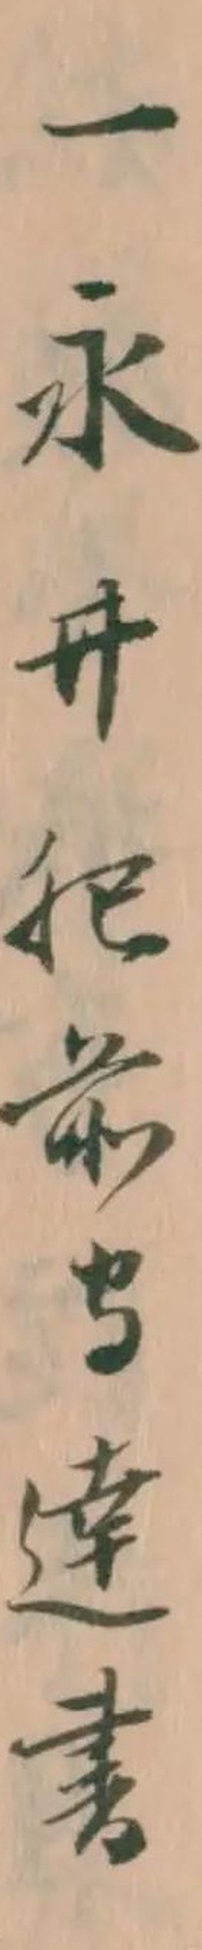一永井肥前守達書
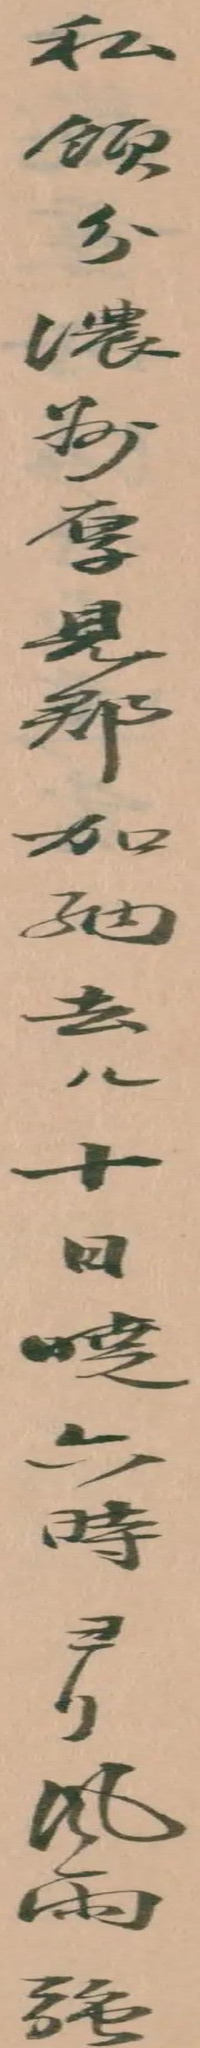私領分濃州厚見郡加納去ル十日暁六時ヨリ風雨強
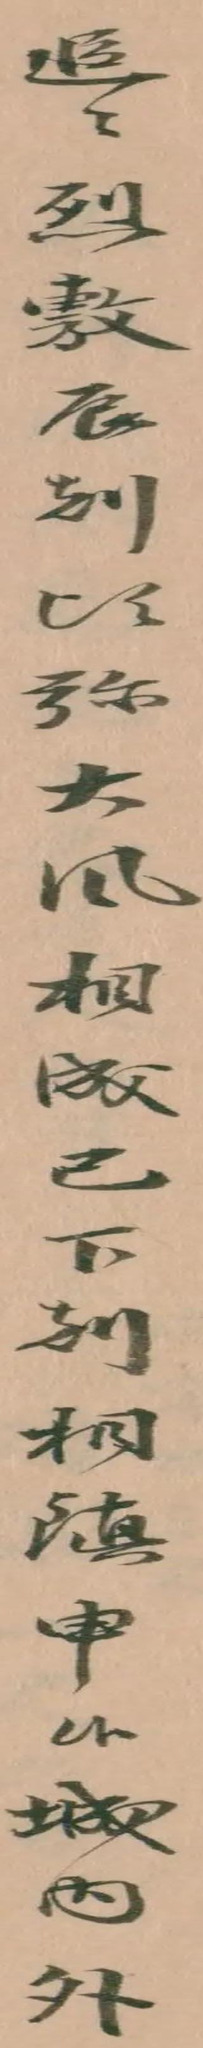追々烈敷辰刻頃弥大風相成巳下刻相鎮申候城内外
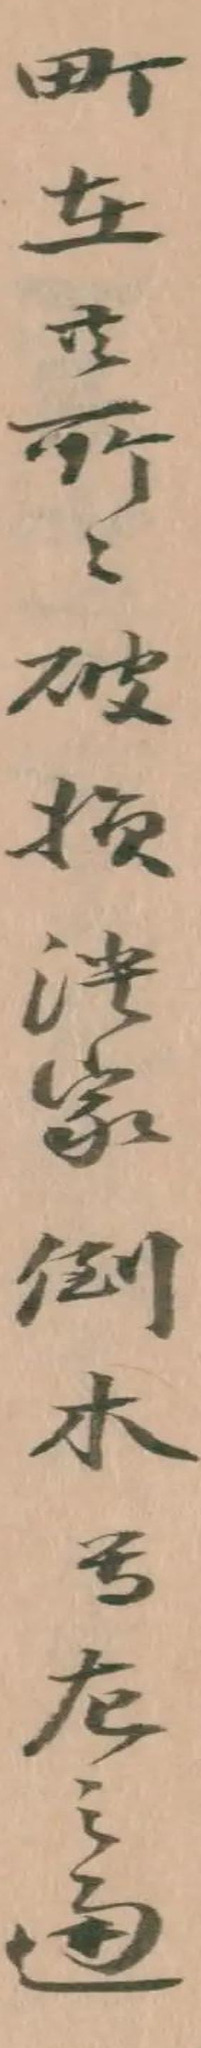町在共所々破損潰家倒木等左之通
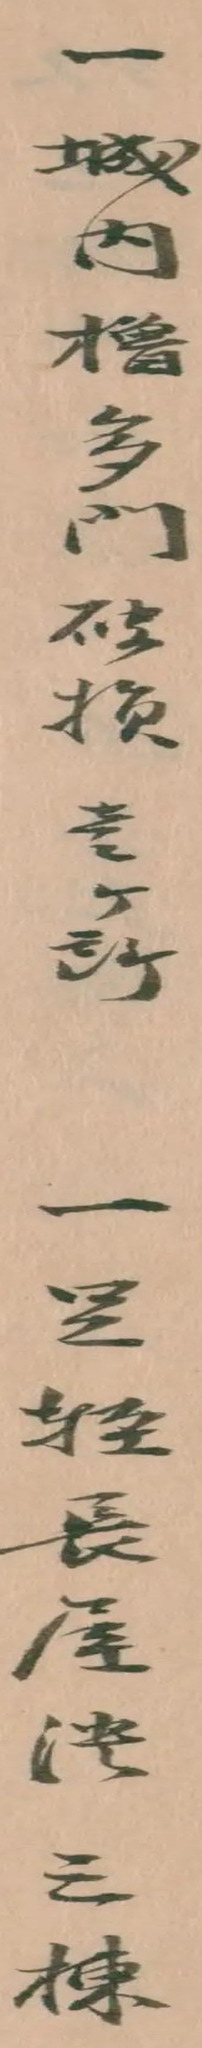一城内櫓多門破損壱ヶ所一足軽長屋潰三棟
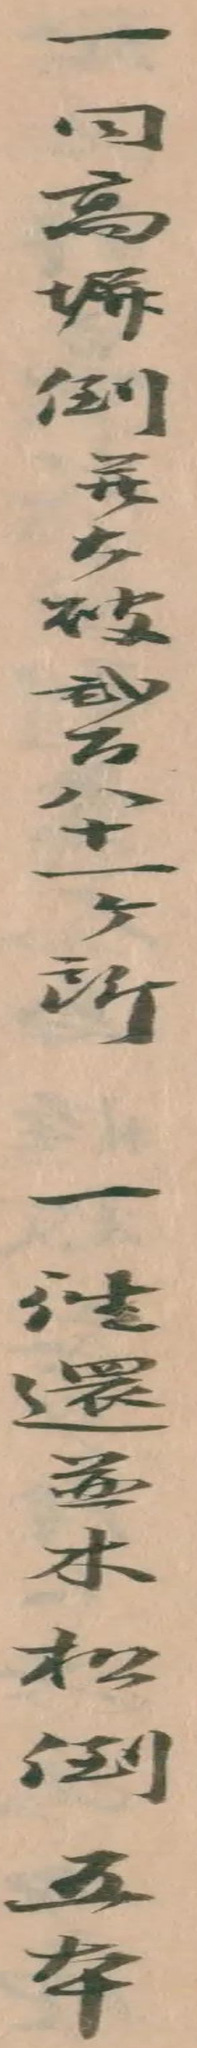一同高塀倒并大破弐百八十一ヶ所一往還並木松倒五本
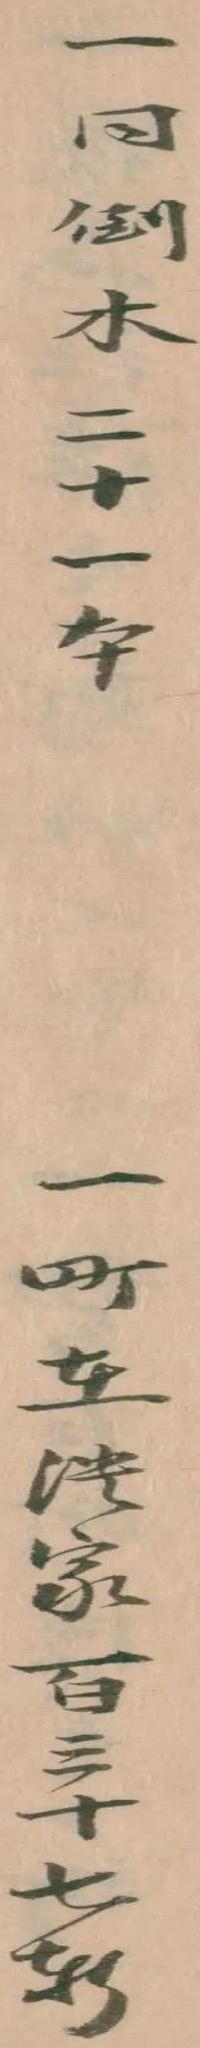一同倒木二十一本一町在潰家百三十七軒
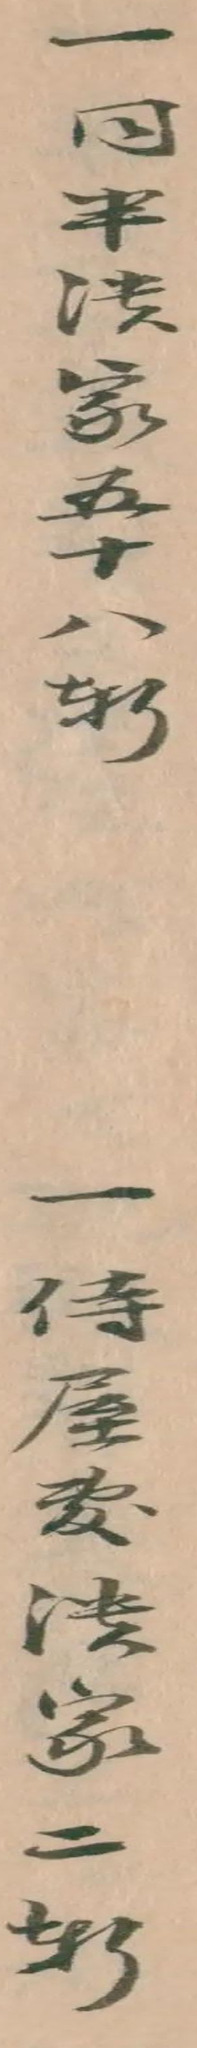一同半潰家五十八軒一侍屋敷潰家二軒
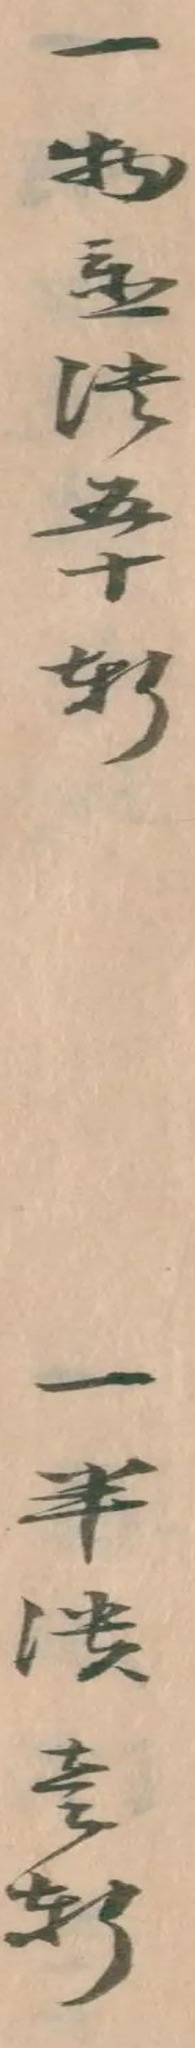一物置潰五十軒一半潰壱軒
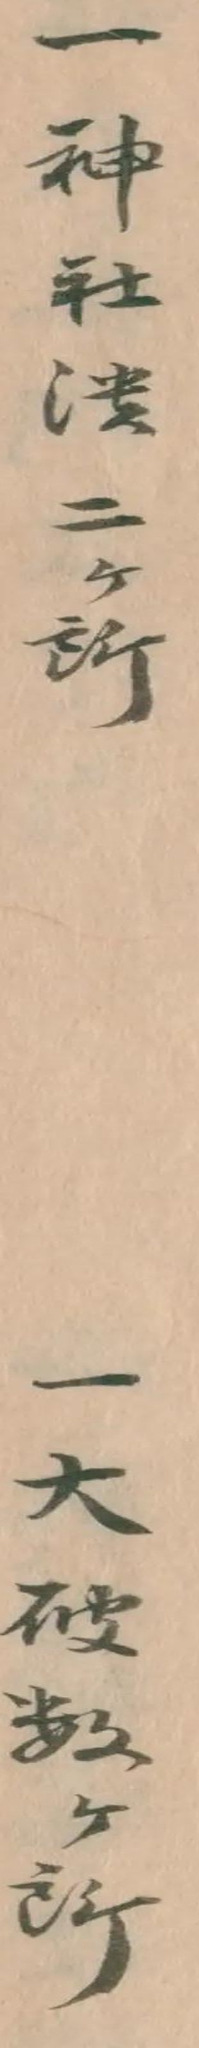一神社潰弐ヶ所一大破数ヶ所

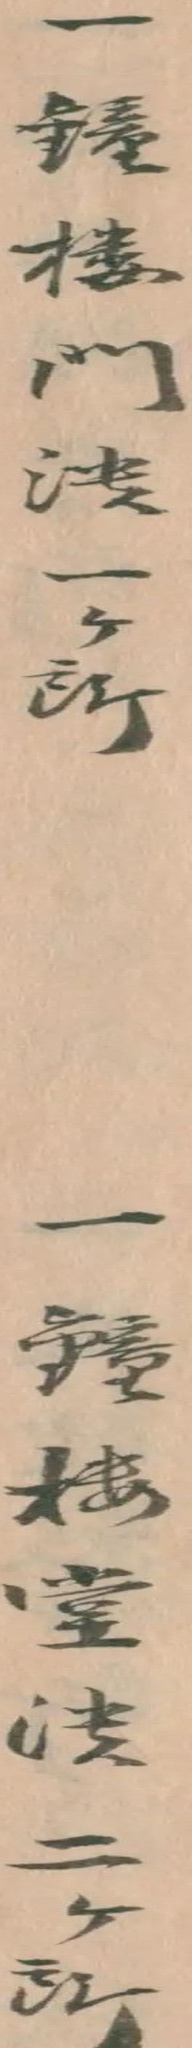一鐘楼門潰一ヶ所一鐘楼堂潰二ヶ所
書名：地災撮要. 巻3(地震之部)-巻4(噴火之部)
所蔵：国立国会図書館 National Diet Library, JAPAN
